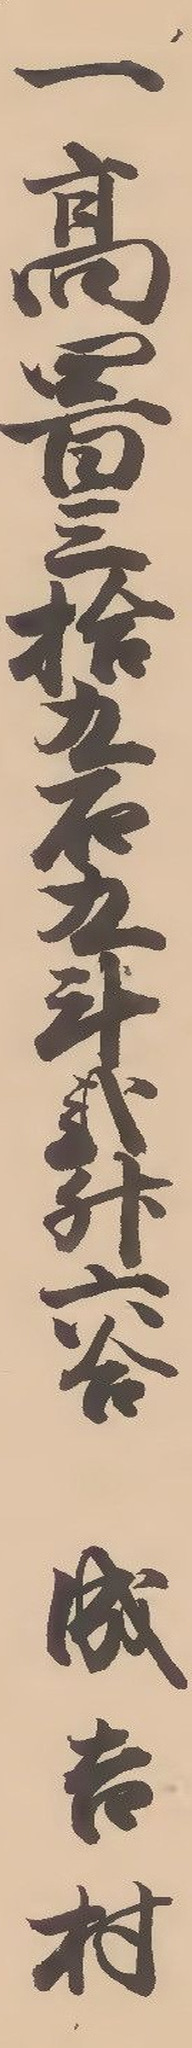一高四百三拾九石九斗弐升六合成吉村
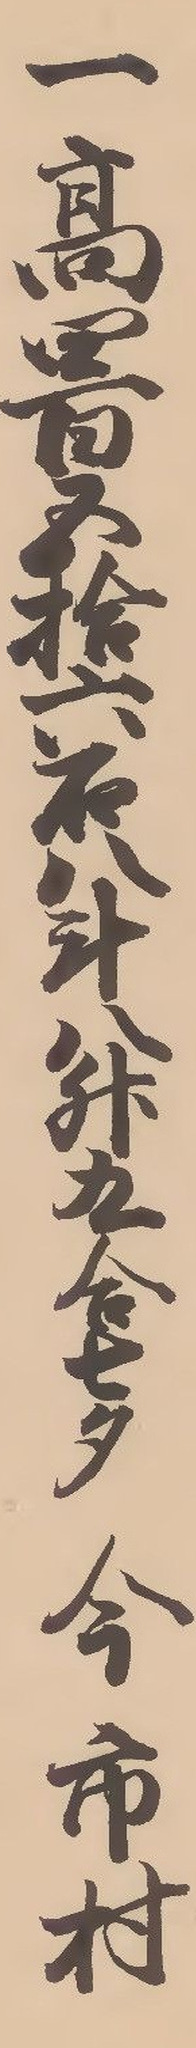一高四百五拾六石八斗八升九合七勺今市村
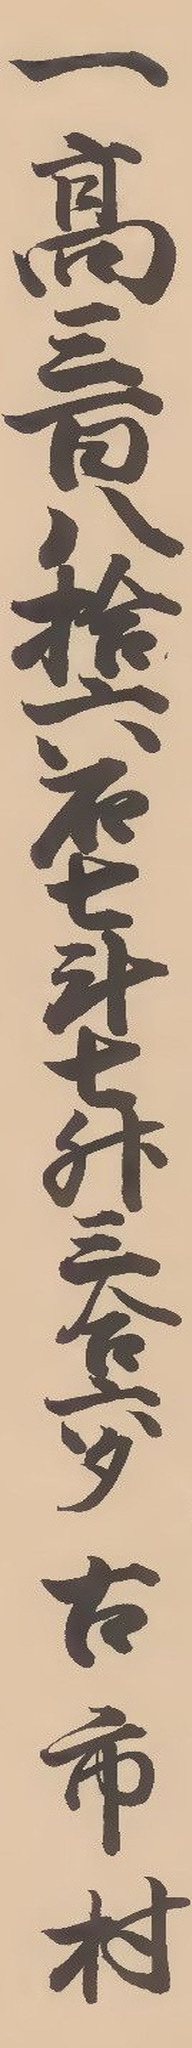一高三百八拾六石七斗七升三合六勺古市村
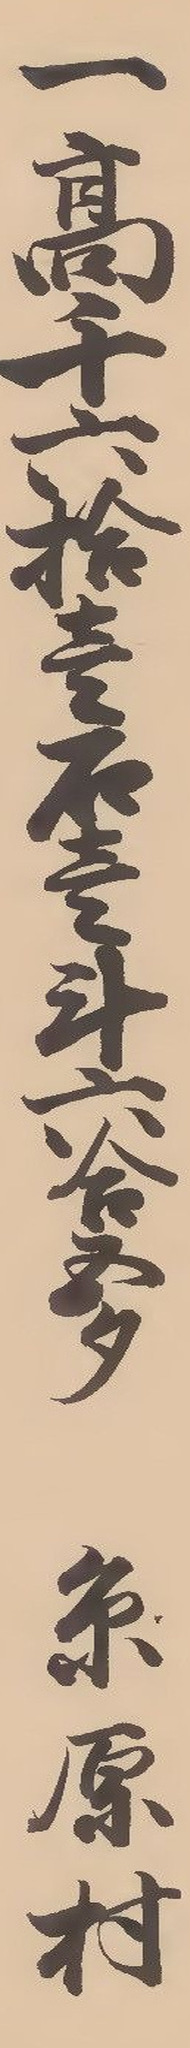一高千六拾壱石壱斗六合五勺糸原村
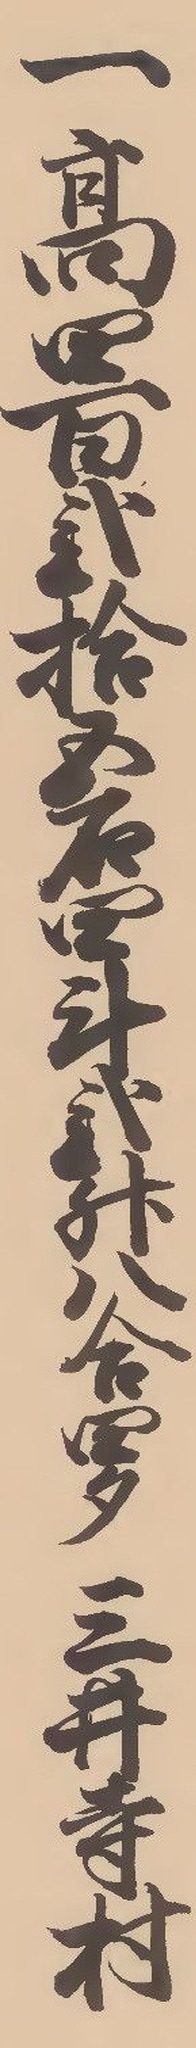一高四百弐拾五石四斗弐升八合四勺三井寺村
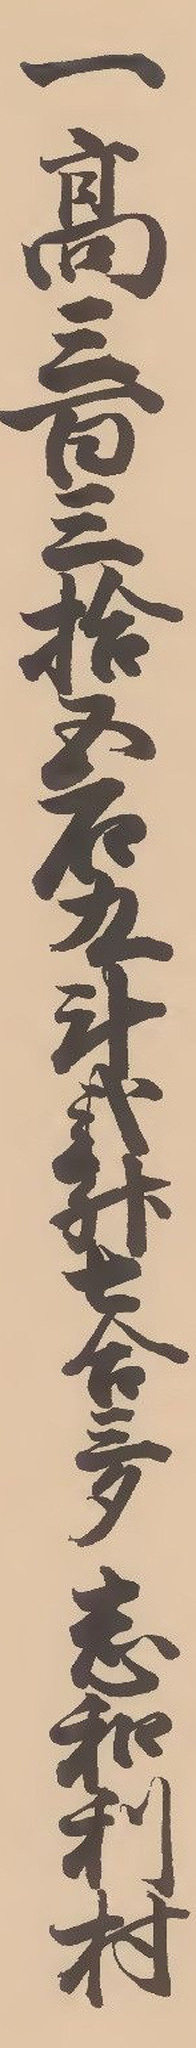一高三百三拾五石九斗弐升七合三勺志和利村

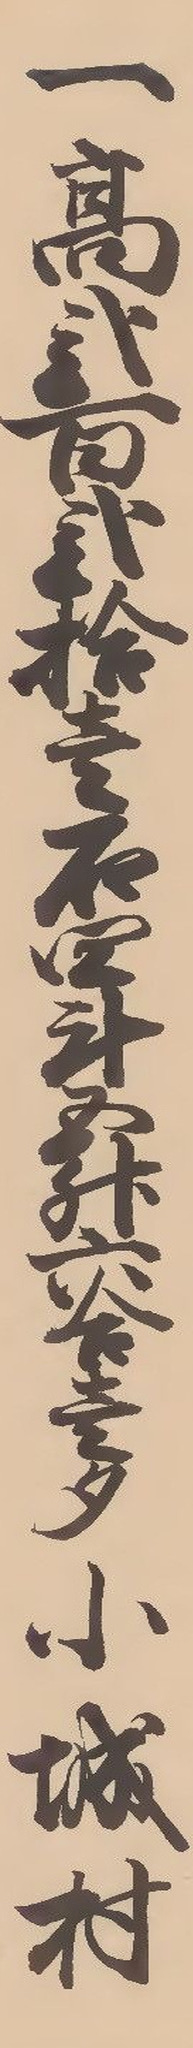一高弐百弐拾壱石四斗五升六合壱勺小城村
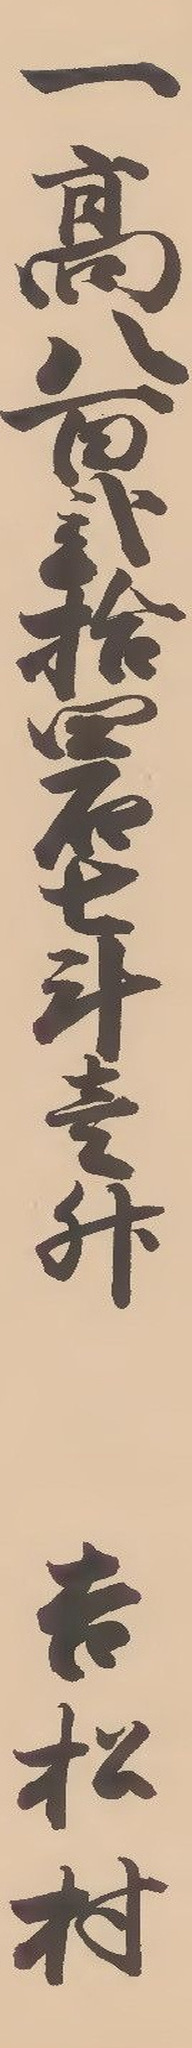一高八百弐拾四石七斗壱升吉松村
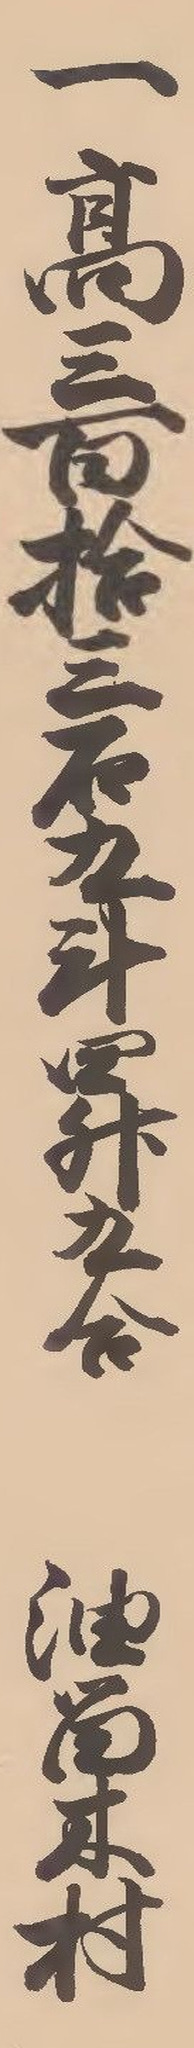一高三百拾三石九斗四升九合油留木村
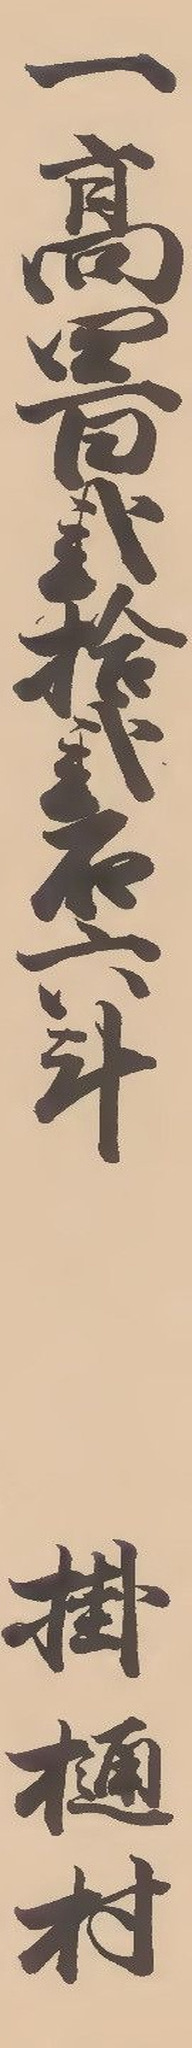一高四百弐拾弐石六斗掛樋村
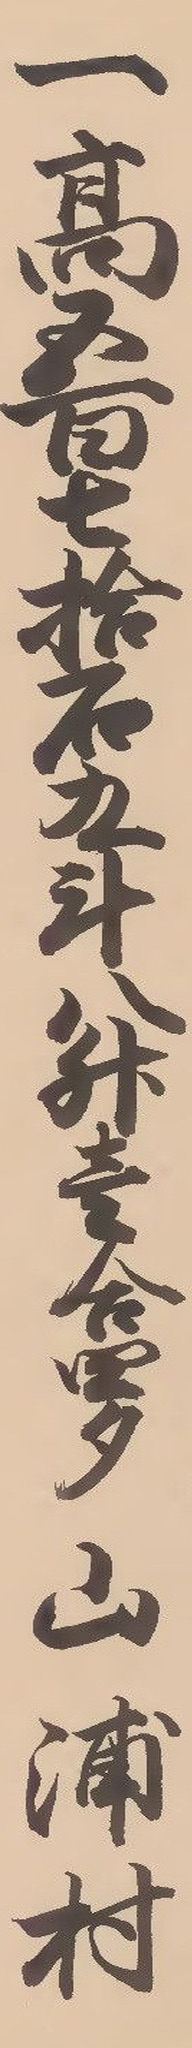一高五百七拾石九斗八升壱合四勺山浦村
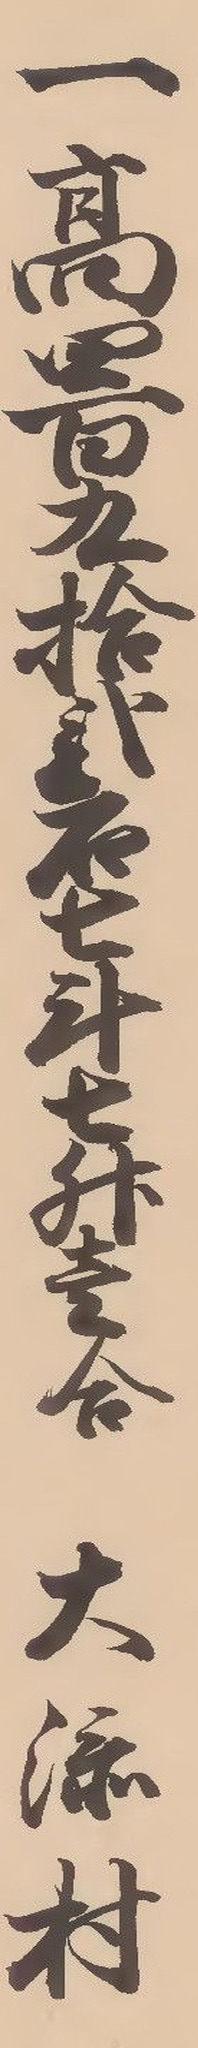一高四百九拾弐石七斗七升壱合大添村
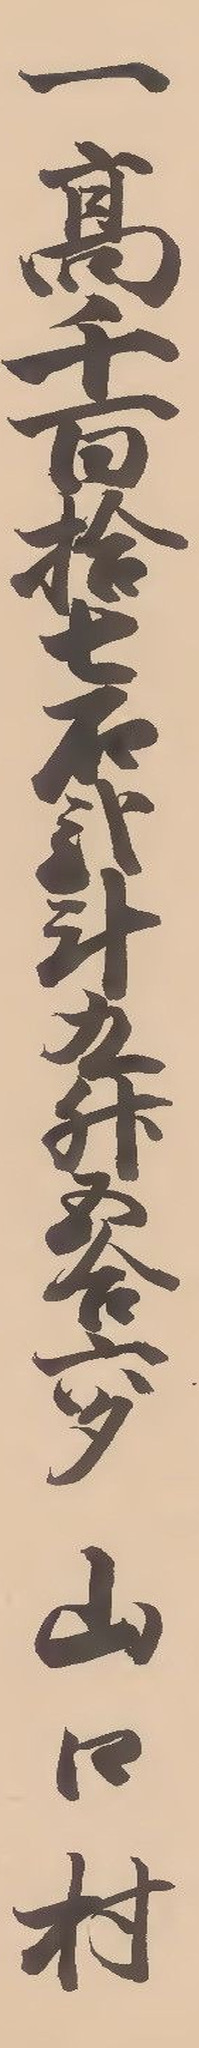一高千百拾七石弐斗九升五合六勺山口村
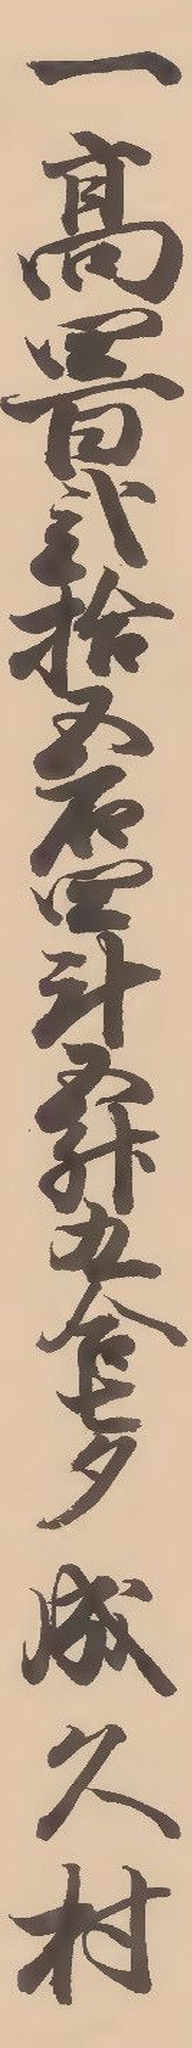一高四百弐拾五石四斗五升九合七勺成久村

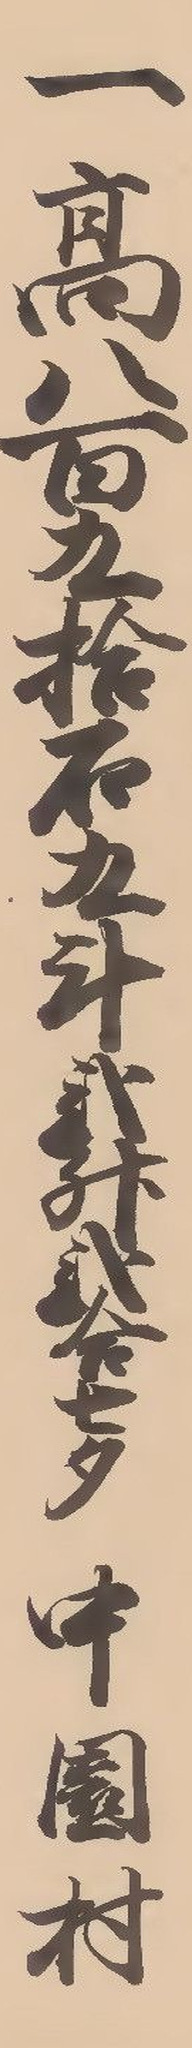一高八百九拾石九斗弐升弐合七勺中園村
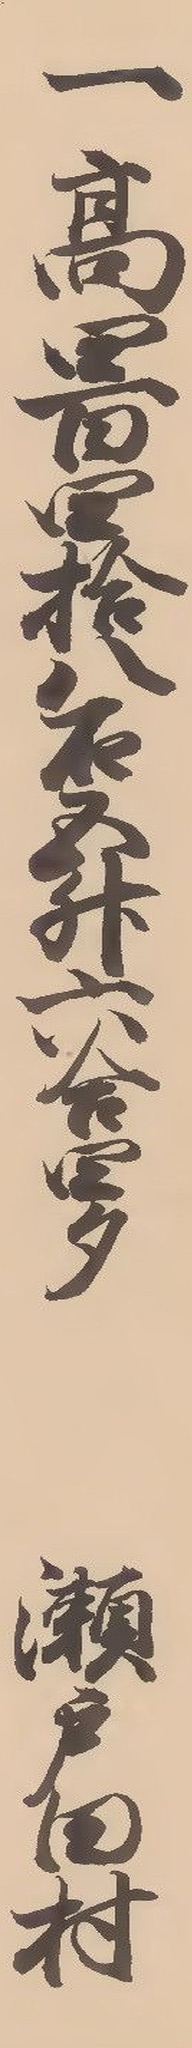一高四百四拾八石五升六合四勺瀬戸田村
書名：豊後国郷帳
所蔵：国立公文書館 National Archives of Japan
